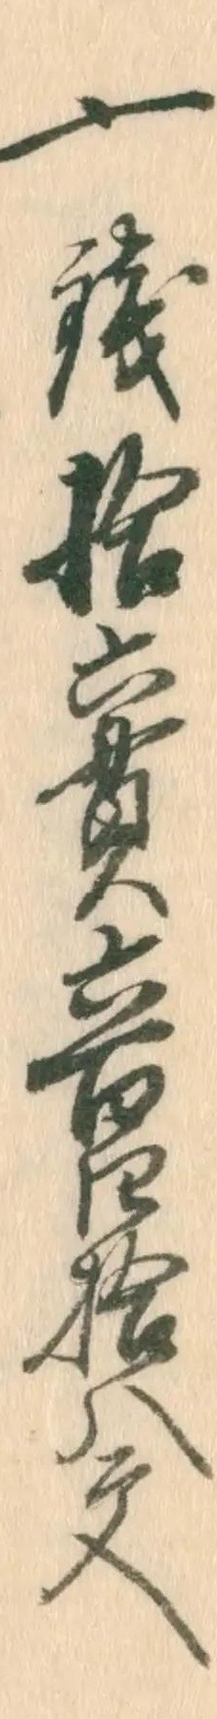〆銭拾六貫六百四拾八文
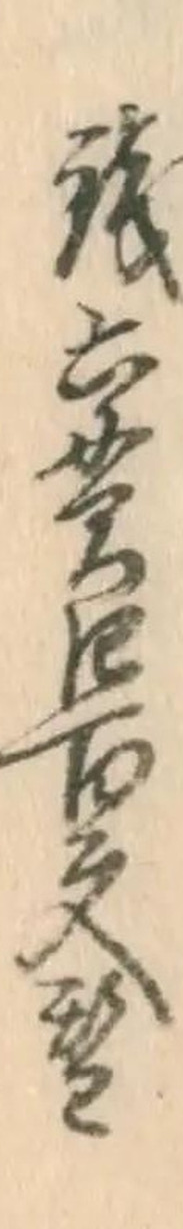銭六貫四百文替
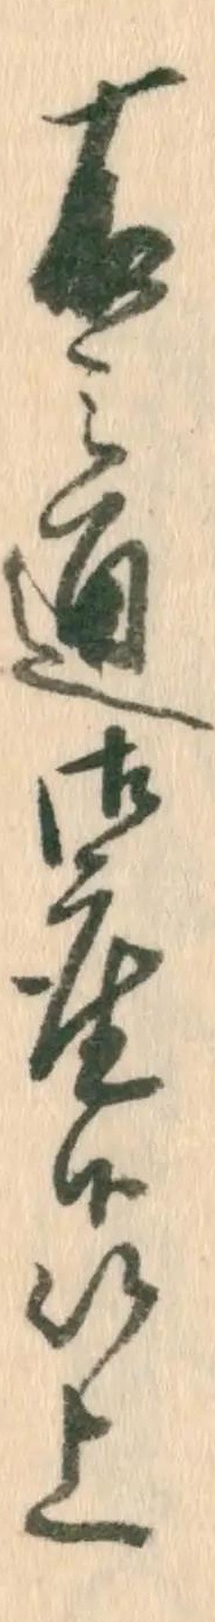右之通御座候以上
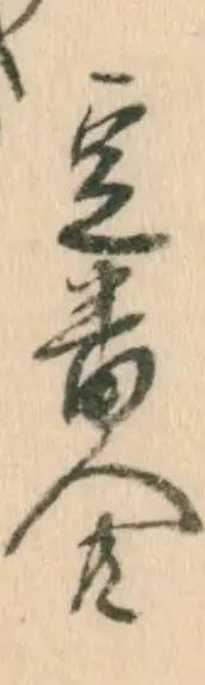定番人共
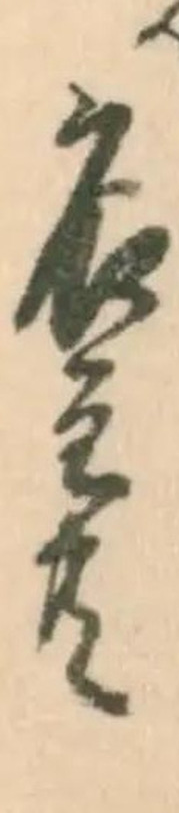名主共
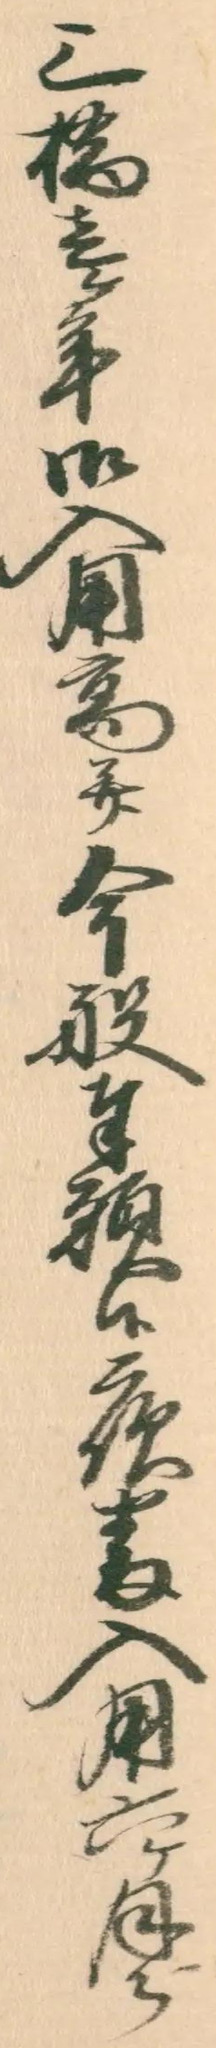三橋壱ケ年御入用高并今般奉願候夜番入用六ケ月分
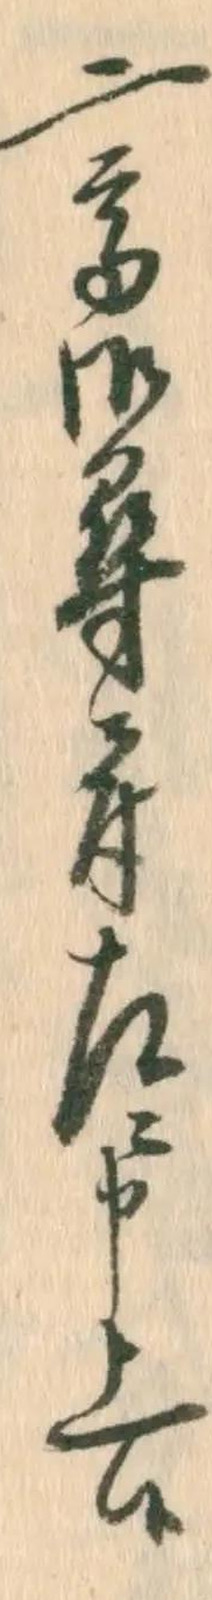〆高御尋ニ付左ニ申上候
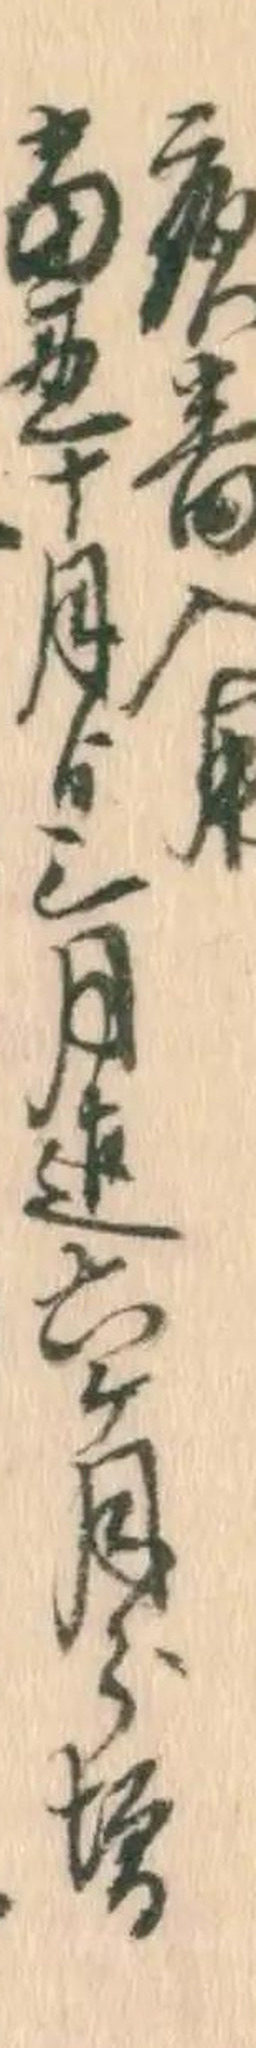当丑十月ゟ三月迄六ケ月分増
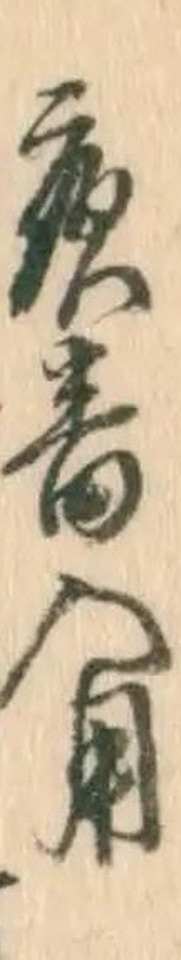夜番入用

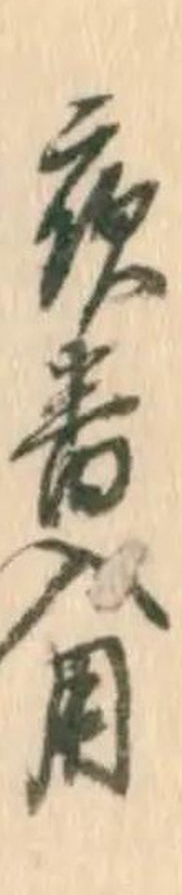夜番入用
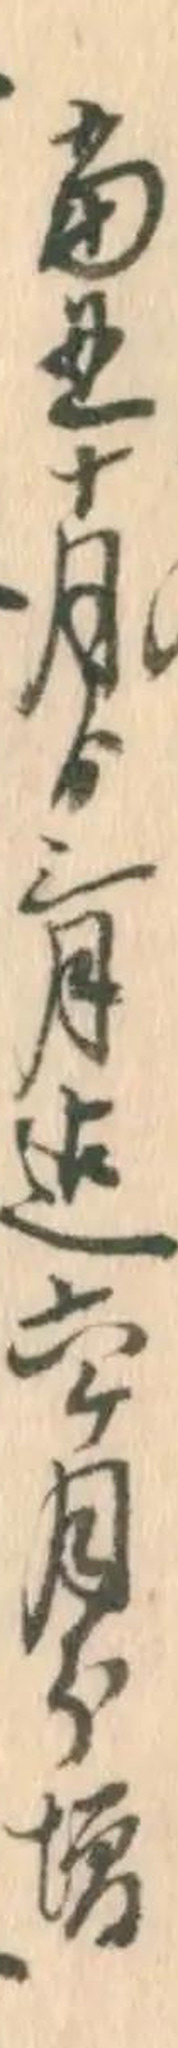当丑十月ゟ三月迄六ケ月分増
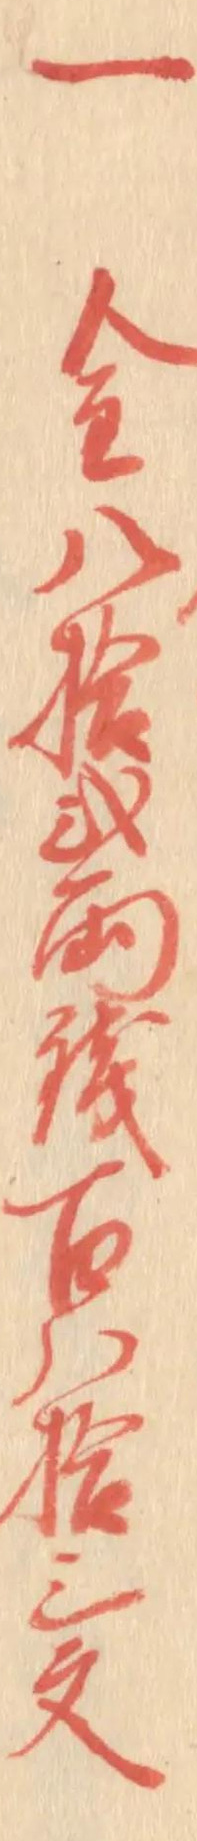一金八拾弐両銭百八拾三文
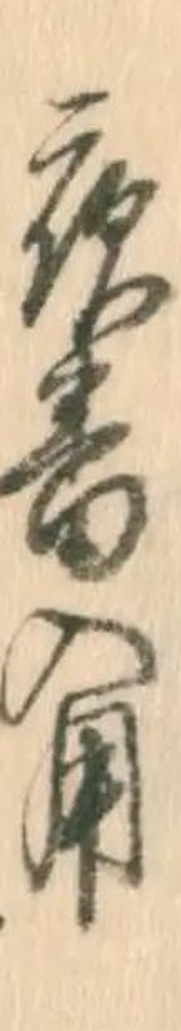夜番入用
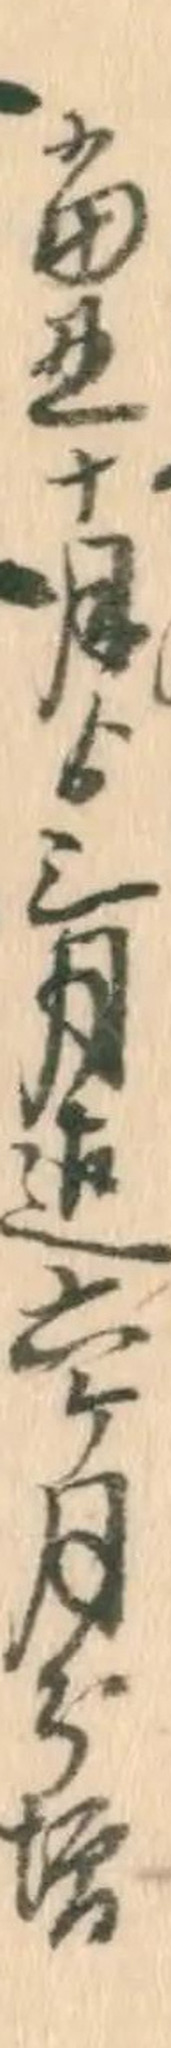当丑十月ゟ三月迄六ケ月分増
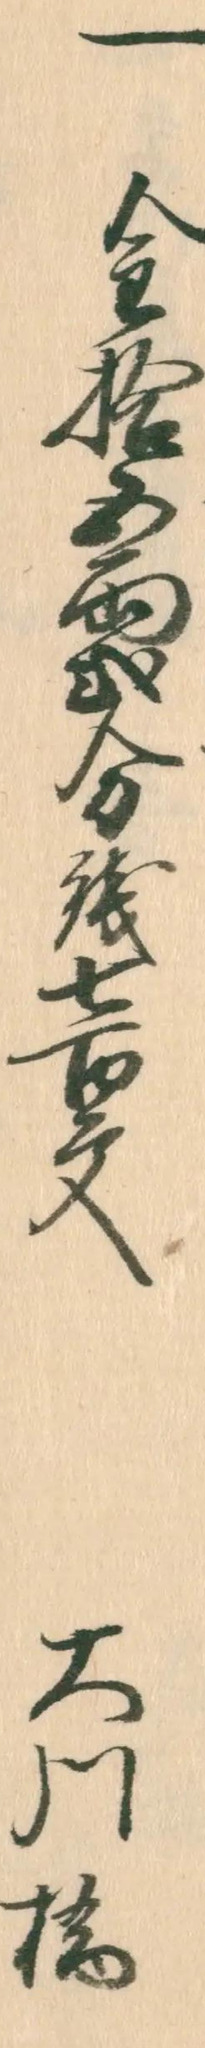一金拾五両弐分銭七百文大川橋
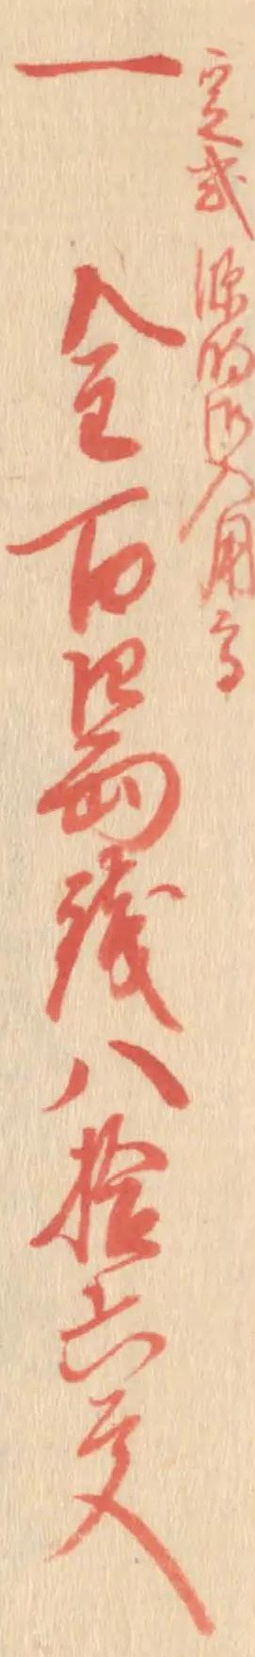一金百四両銭八拾六文
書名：三橋 17巻. [7] 三橋小破御修復書留　但御奉行御掛リ替地震潰橋番屋　嘉永四亥年より安政二卯年迄　上
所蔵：国立国会図書館 National Diet Library, JAPAN
